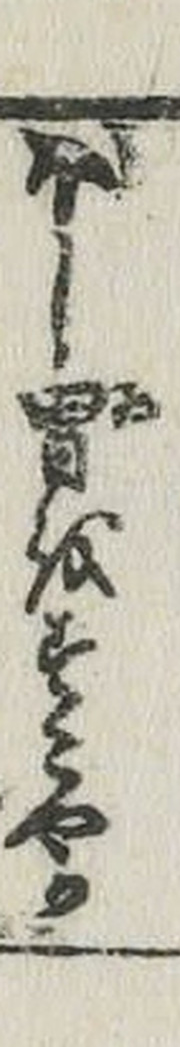ほし胃をすこやか
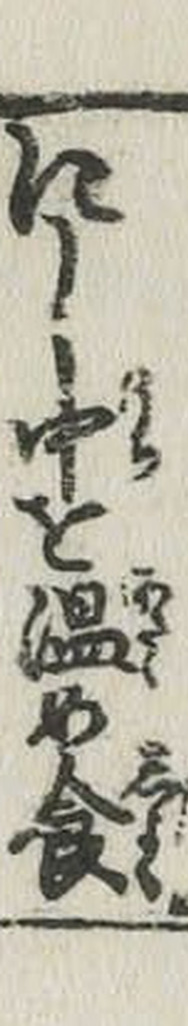にし中を温め食
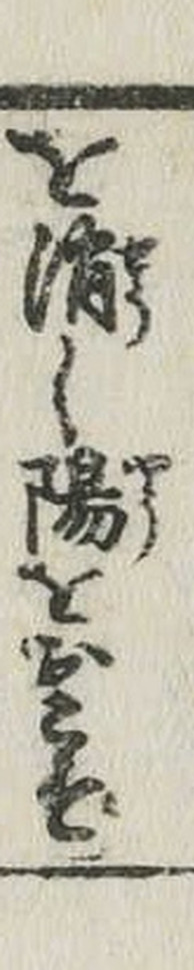を消し陽をおこす
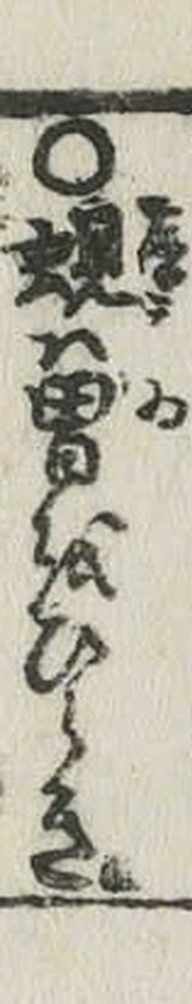○蜆は胃をひらき
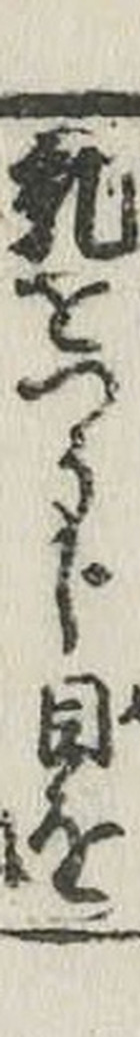乳をつうじ目を
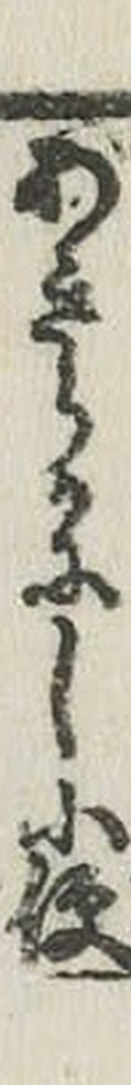あきらかにし小便
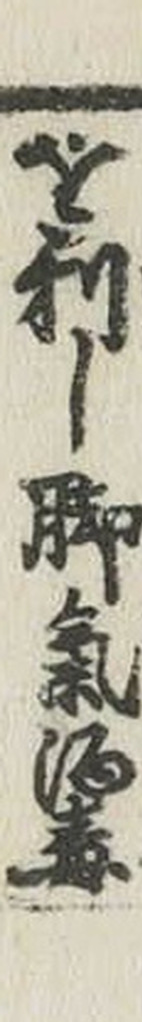を利し脚気酒毒
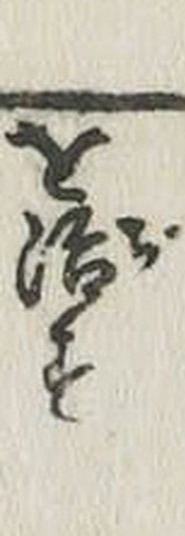を治す
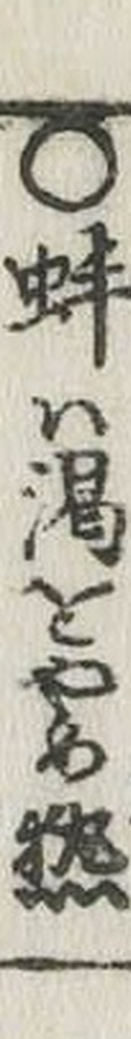○蚌は渇をやめ熱
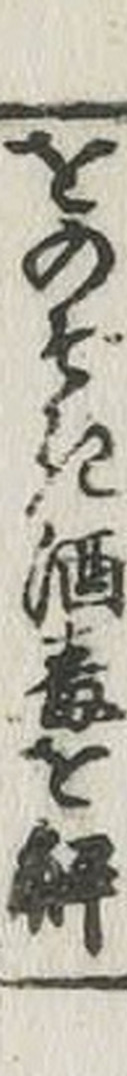をのぞき酒毒を解
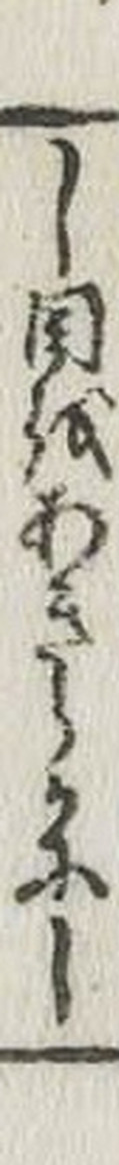し目をあきらかにし
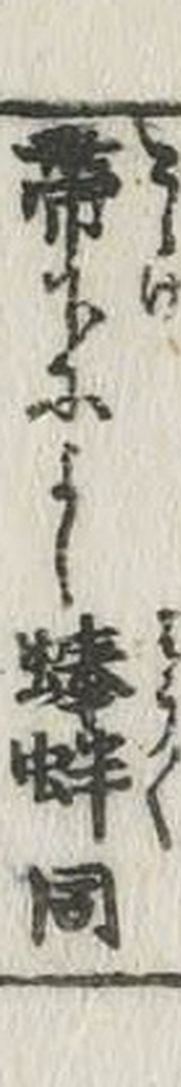帯下によし蜯𧉻同
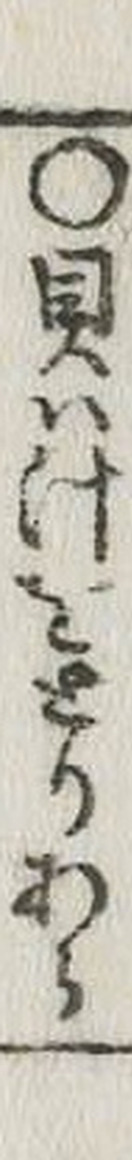○貝は汁をとりあら
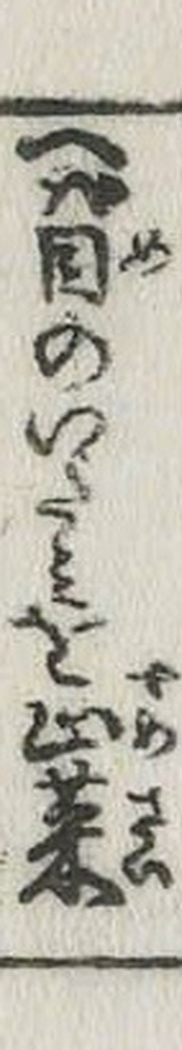へば目のいたみを止菜
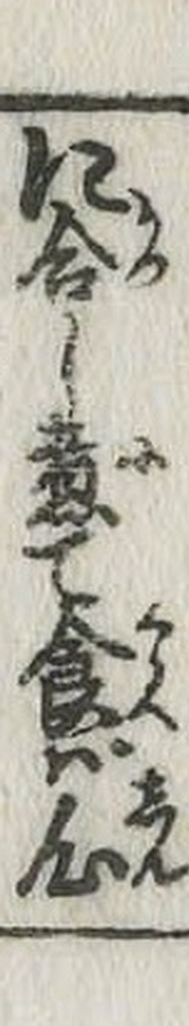に合し煮て食ば心
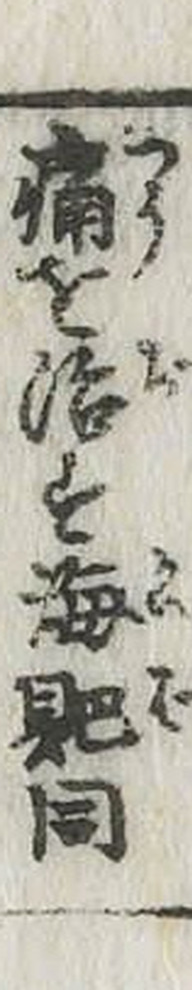痛を治す海𧵅同
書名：増補頭書訓蒙図彙大成 10巻 7:巻之14-16
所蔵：東京学芸大学教育コンテンツアーカイブ
